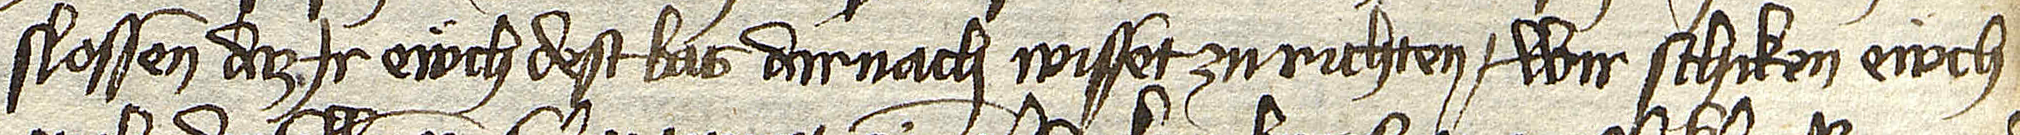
ſloſſen daʒ Ir eẅch deſt bas darnach wiſſet ʒu richten / Wir ſchiken eẅch
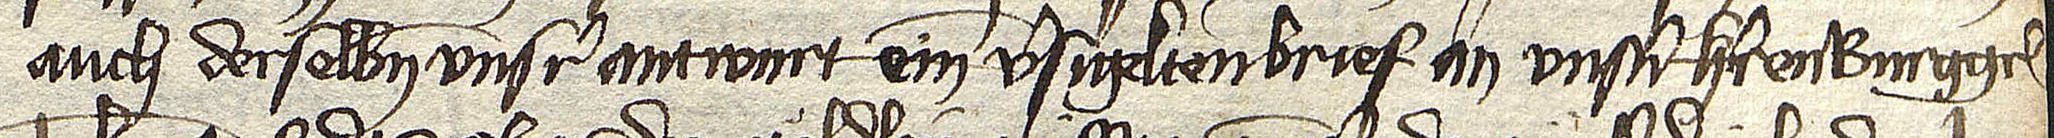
auch derſelbn* vnſr* antwurt ein* v*ſigelten brief an vnſn* h*ren Burggr*
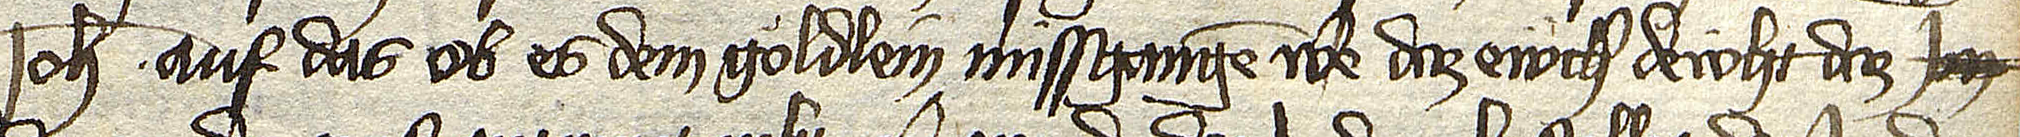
Ioh* . auf das ob es dem göldlein miſſgange* w*e daʒ eẅch deẅht daʒ Im
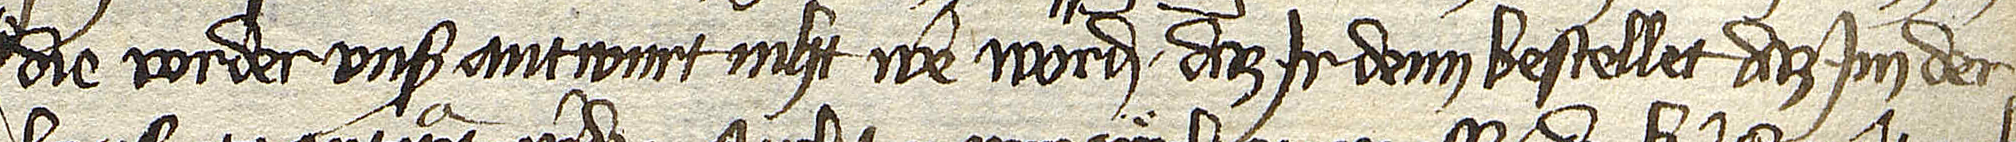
die vorder vnſ* antwurt niht w*e word* / daʒ Ir denn beſtellet daʒ Im der
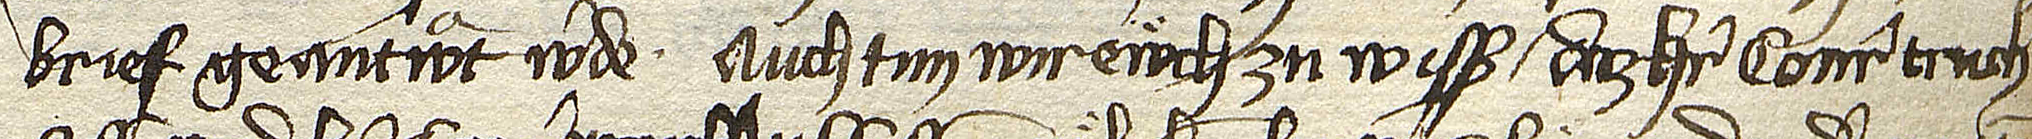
brief geantw*t w*de . Auch tun wir eẅch ʒu wiſſ* / daʒ hr* Conr* truch
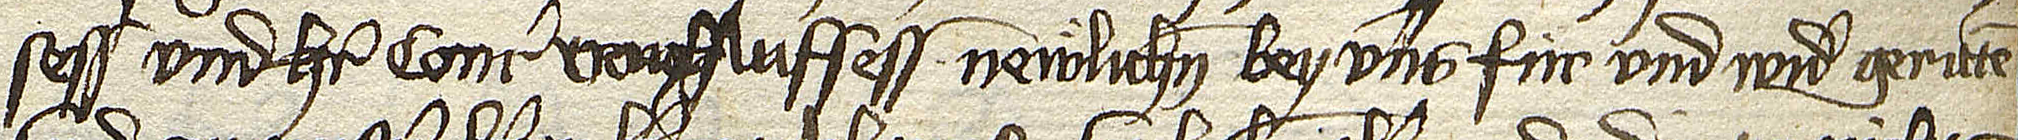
ſeſſ vnd hr* Conr* %%%%% Aufſeſſ . neẅlich bey vns für vnd wid* geritte*
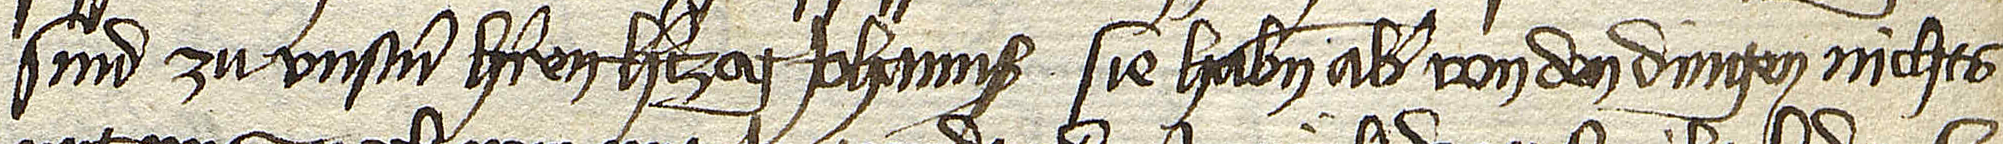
ſind ʒu vnſm* h*ren h*cʒog Iohannſ* ſie habn* ab* von den dingen nichts
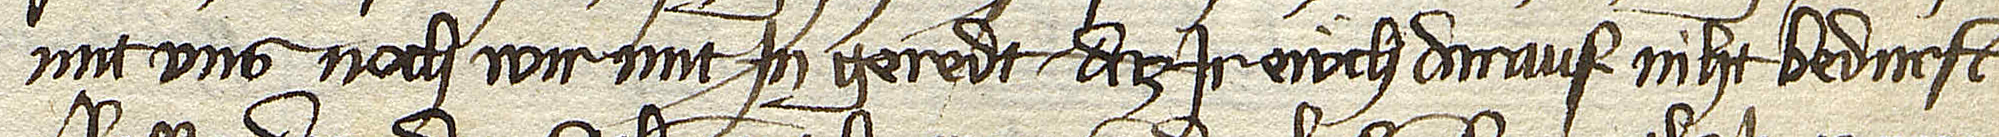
mit vns noch wir mit In geredt / daʒ Ir eẅch darauf niht bedurft
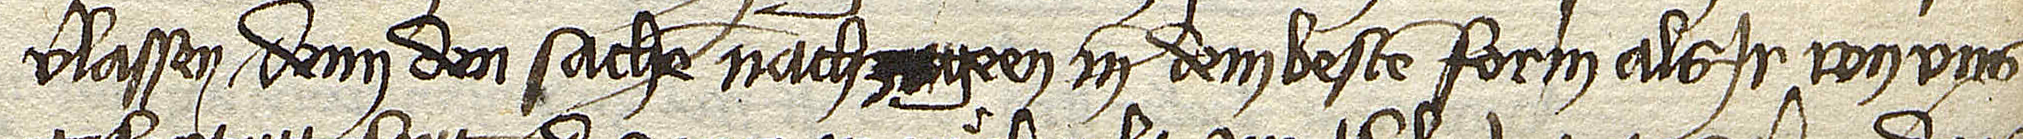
v*laſſen / Denn den ſache* nach ʒu geen in dem beſte* form als Ir von vns
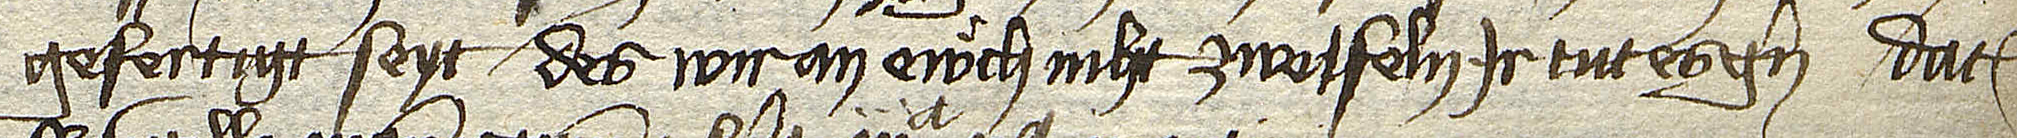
gefertigt ſeyt / Des wir an eẅch niht ʒweifeln Ir tut es g*n / dat*
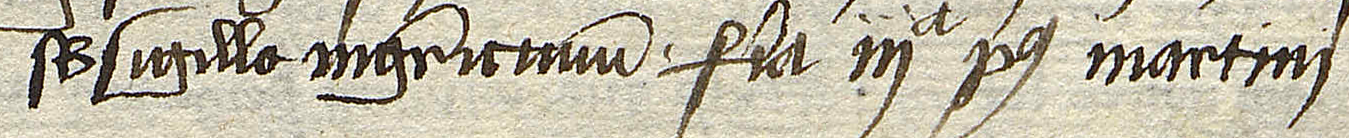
ſ* ſigillo m*griciuiu* . fi*a iii* p* martini
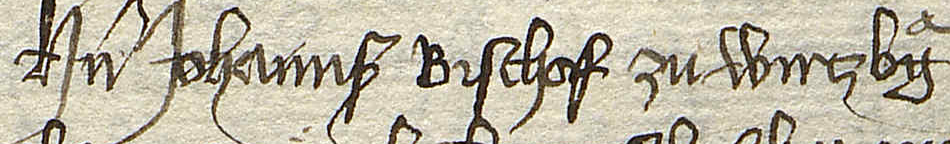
Hn* Iohannſ* Biſchof ʒu Wircʒb*g
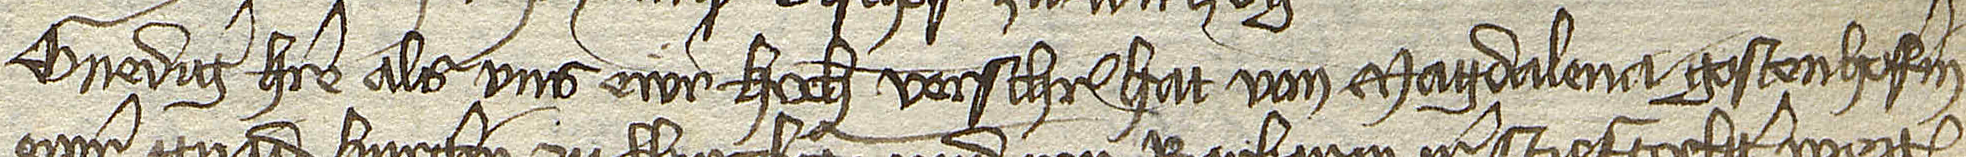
Gnedig* h*re als vns eẅr hoch* verſchr* hat von Magdalena goſtenhof*in
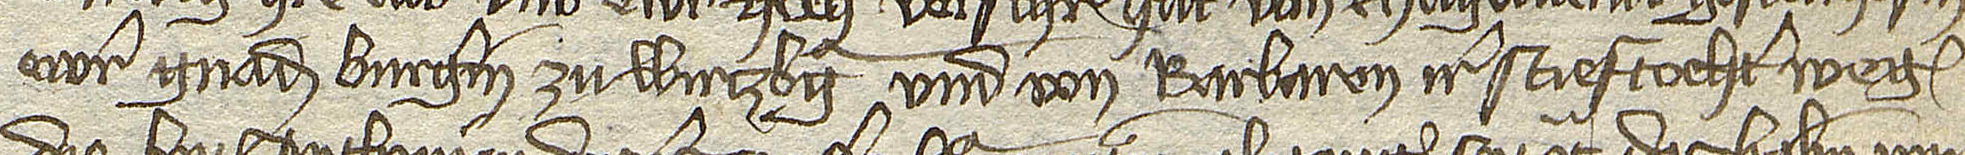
ewr* gnad* burg*in ʒu Wircʒb*g vnd von Barbaren ir* ſtieftocht* weg*
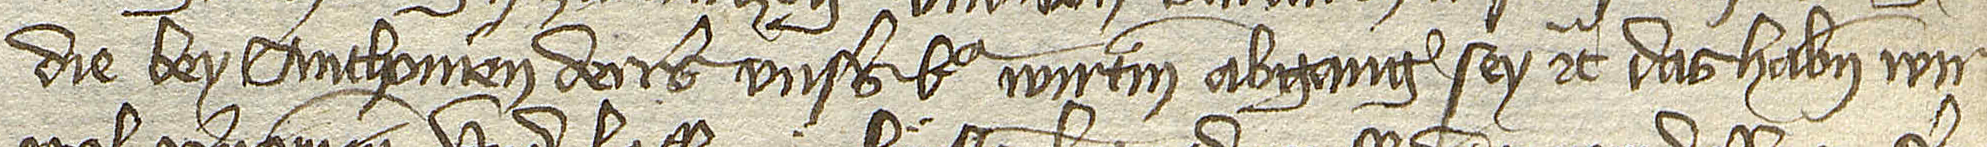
die bey Anthonien derr*s vnſ*s b* wirtin* abgang* ſey ec* Das habn* wir
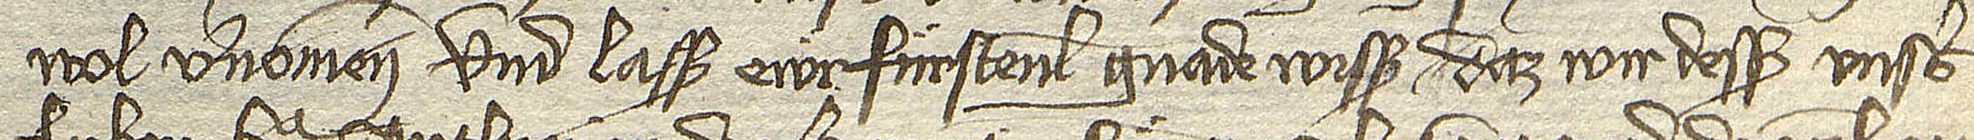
wol v*nom*en Vnd laſſ* eẅr fürſtenl* gnade wiſſ* / Daʒ wir deſſ* vnſ*s
